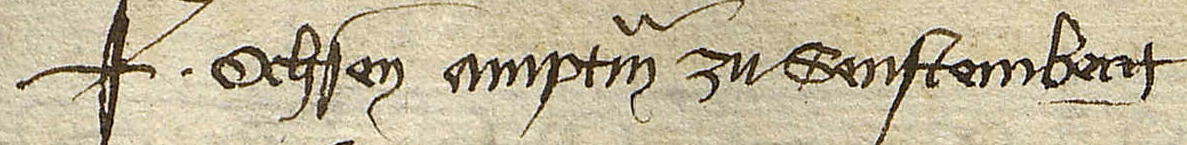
F* . Ochſen amptm* ʒu Senftemberg
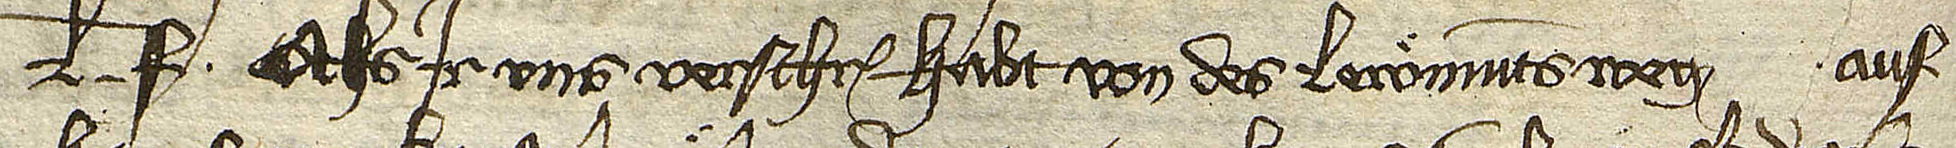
L* f . Als Ir vns verſchr* habt von des Lewmuts* weg* . auf
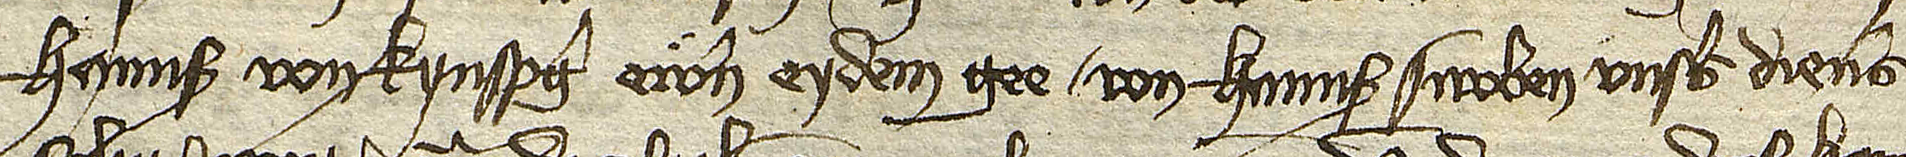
hannſ* von kynſpg* ew*n eydem gee / von hannſ* ſwoben vnſ*s dien*s
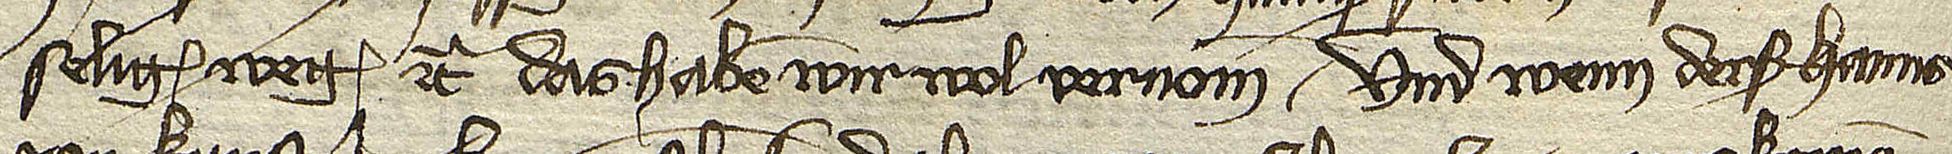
ſelig* weg* ec* das habe* wir wol vernom* / Vnd wenn derſ* Hanns
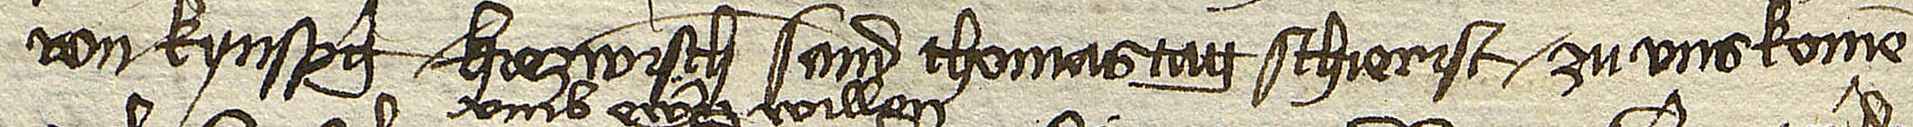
von Kynſp*g / hieʒwiſch* ſand thomastag ſchieriſt / ʒu vns kome*
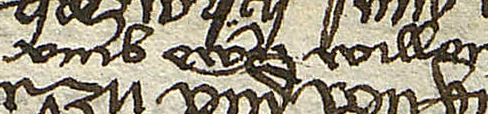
vmb ew*n willen
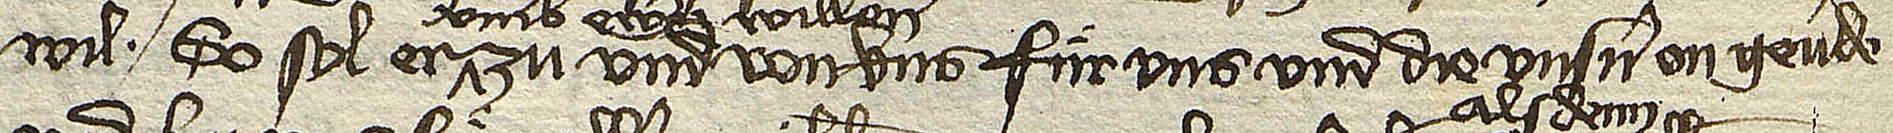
wil . So ſol er ʒu vnd von vns für vns vnd die vnſn* on geu*de
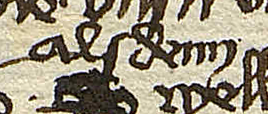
alſdenn
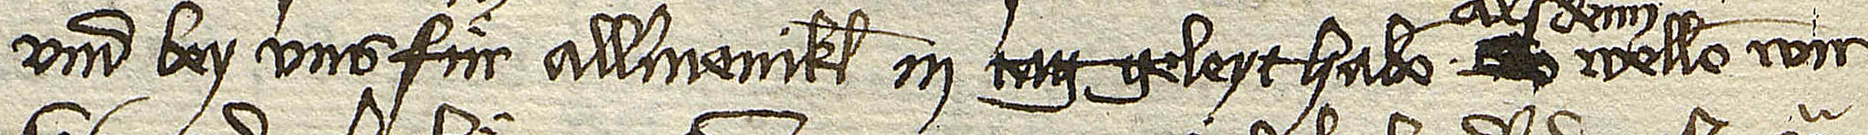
vnd bey vns für all*menikl* iii tag geleyt habe. So welle* wir
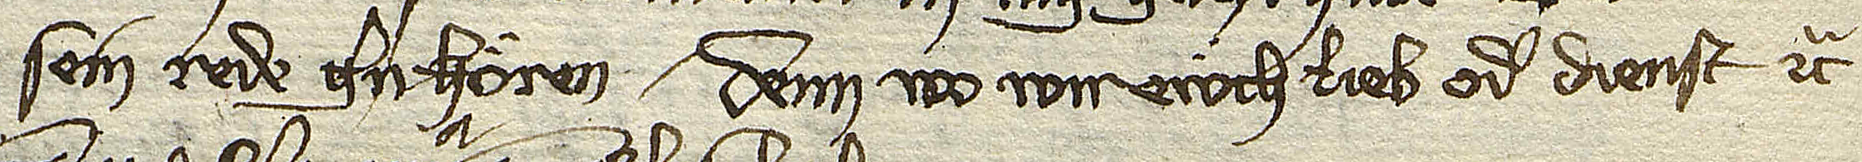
ſein rede g*n hören / Denn wo wir ewch lieb od* dienſt ec*
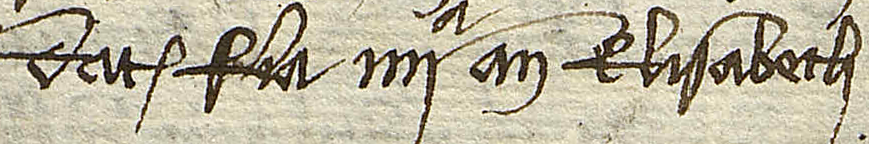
Dat* fi*a iiii* an* Eliſabeth
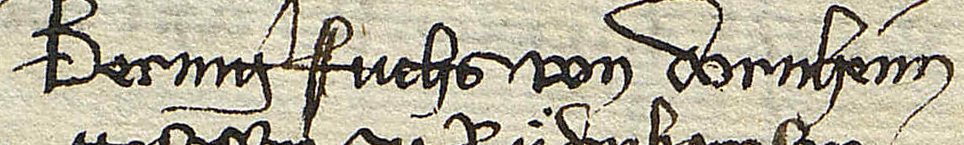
Bering* fuchs von Dornheim
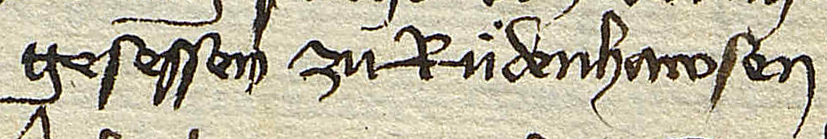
geſeſſen ʒu Rüdenhawfen
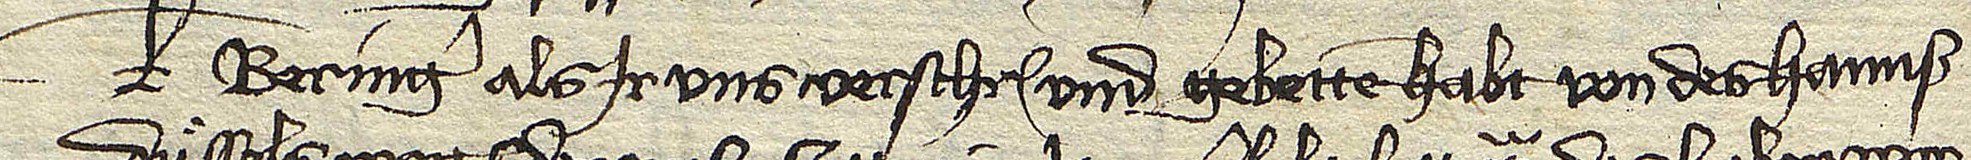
L* Bering* als Ir vns verſchr* vnd gebette* habt von des hannſ*
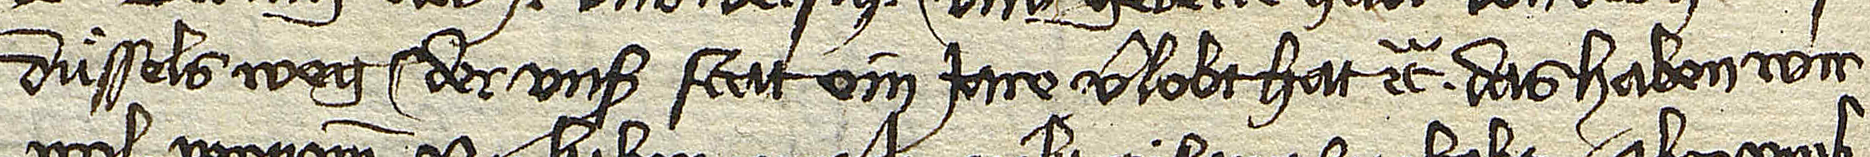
düſſels weg* der vnſ* ſtat ein Iare v*lobt hat ec* . das haben wir
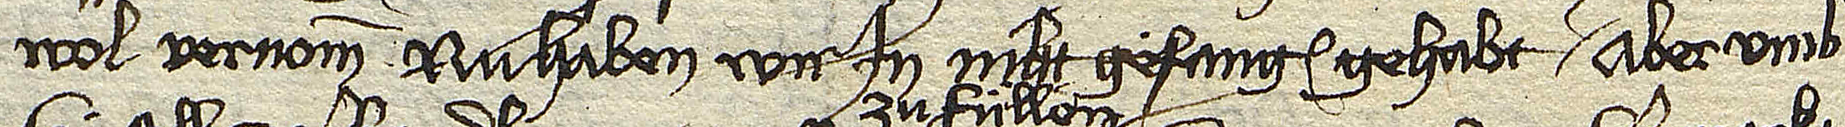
wol vernom* . Nu haben wir In niht gefang* gehabt / aber vmb
